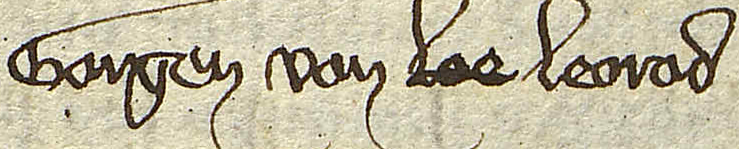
Gorgen von Loe Leorad
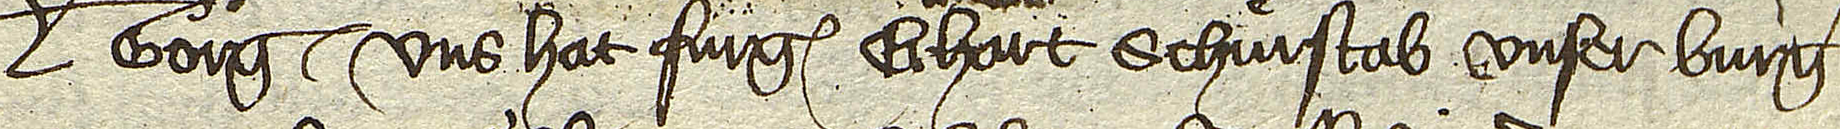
L* Görg* / vns hat fürg* Erhart Schürſtab vnſer burg*
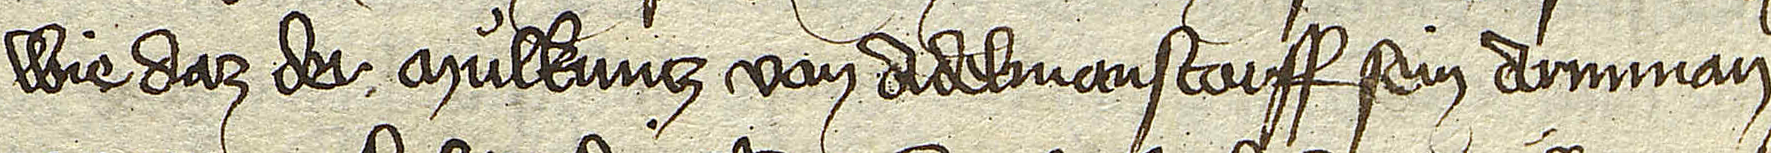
wie daʒ der Mülkuncʒ von Adelmanſtorff ſein Armman
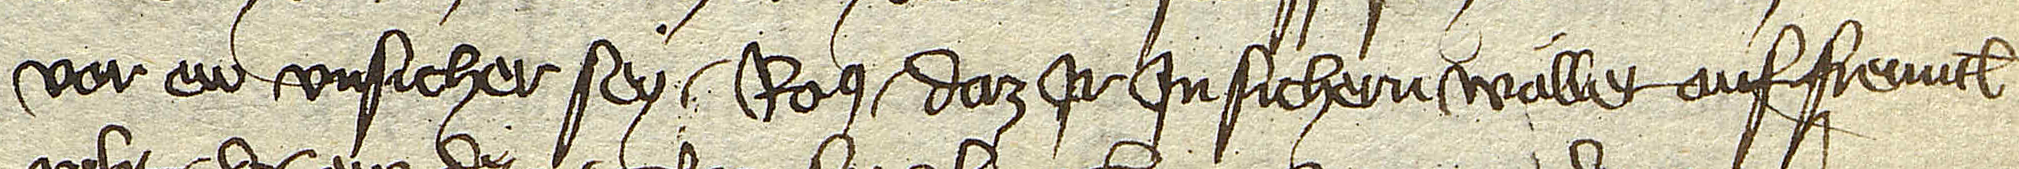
vor ew vnſicher ſey / Ro* / daʒ Ir In ſichern wöllet auf freuntl*
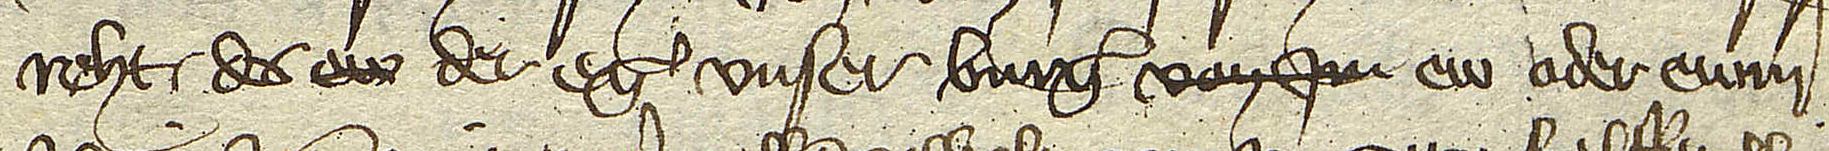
reht / des ew der eg* vnſer burg* von Im ew oder ewm*
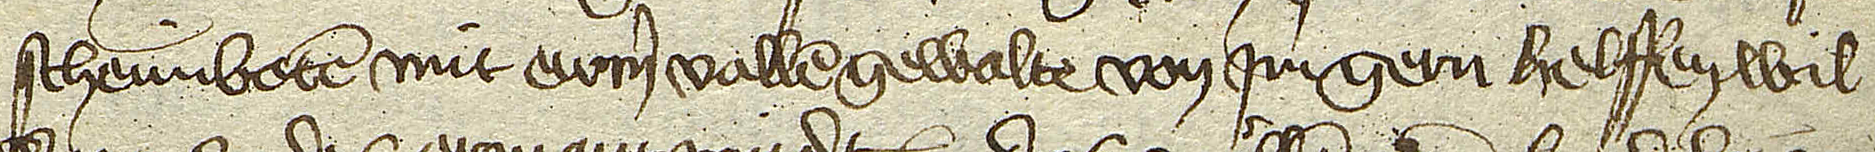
ſcheimbote* mit ewm* volle* gewalte von Im gern helffen wil
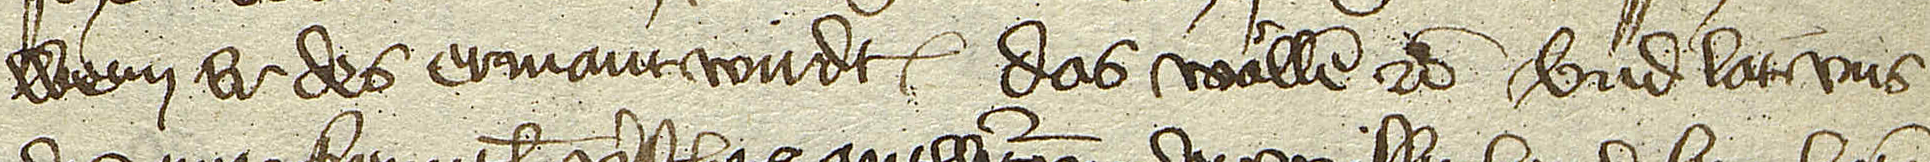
wenn Er des ermant wirdt / das wölle* ec* / vnd lat vns
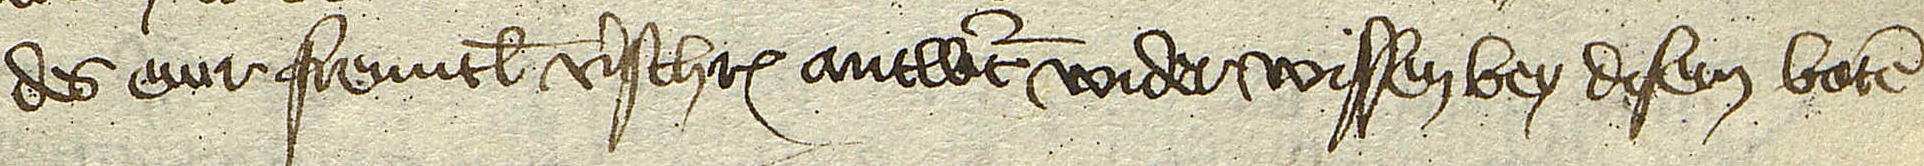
des ewr freuntl* v*ſchr* antwt* widerwiſſen bey diſem bote*
